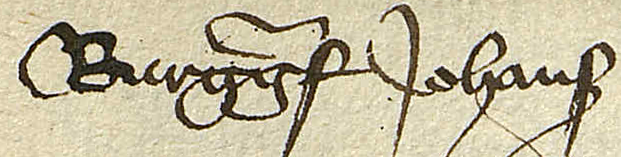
Burgg*f Iohanſ*
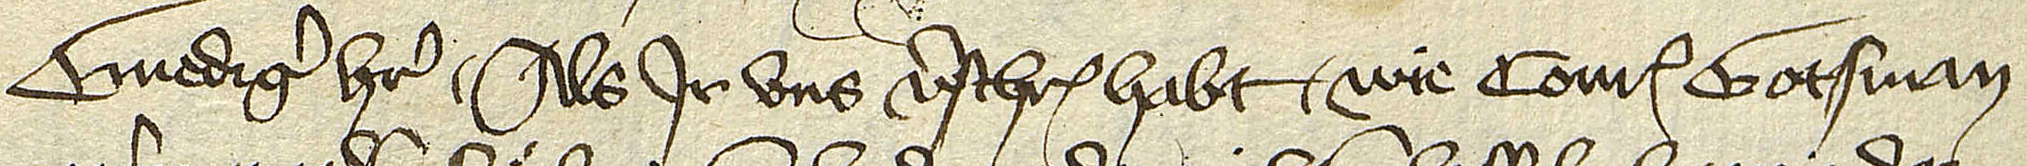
Gnedig* hr* / Als Ir vns v*ſchr* habt / wie Conr* Gotſman
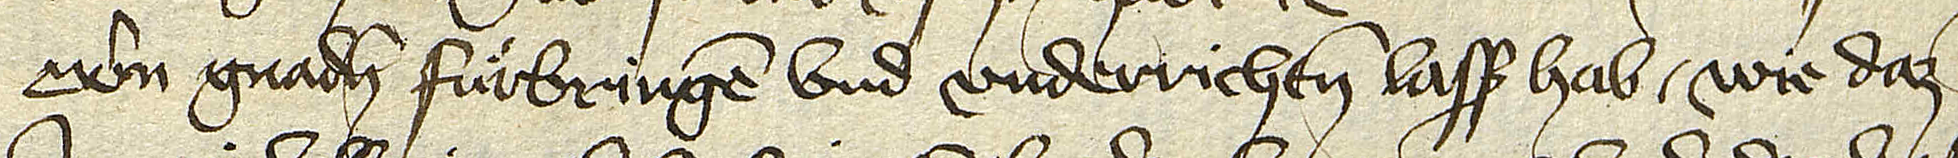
ew*n gnadn* fürbringe* vnd vnderrichtn* laſſ* hab / wie daʒ
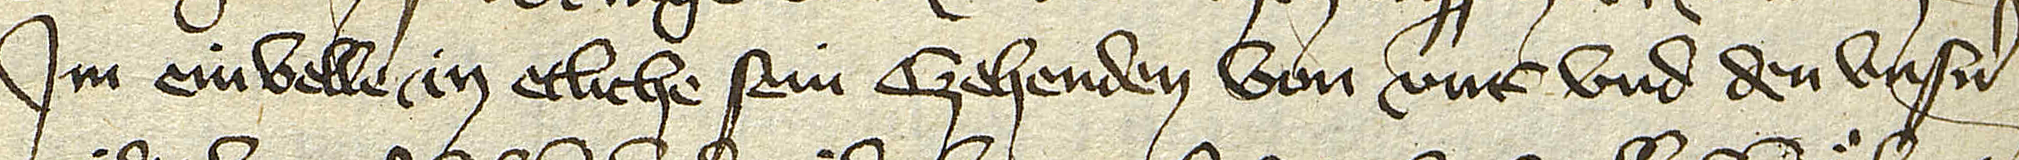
Im einvelle / in etliche ſein Cʒehenden von vns vnd den vnſn*
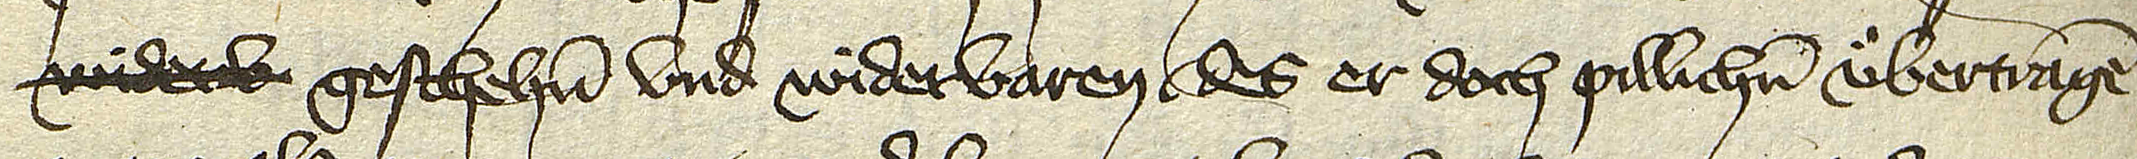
widerk geſchehn* vnd widervaren / des er doch pillichn* v̈bertrage*
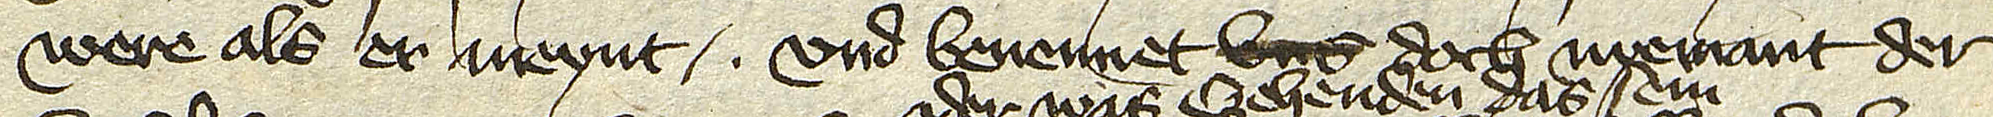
were als er meynt / . vnd benennet vns doch nyemant der
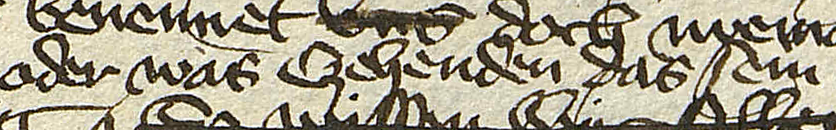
oder was Cʒehenden das ſein
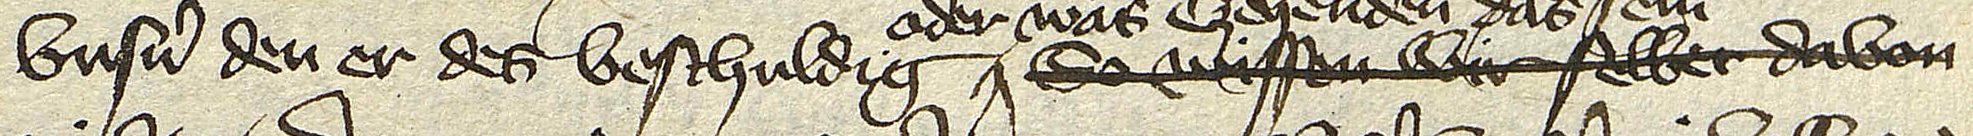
vnſn* den er des beſchuldig / So wiſſen wir ſelber davon
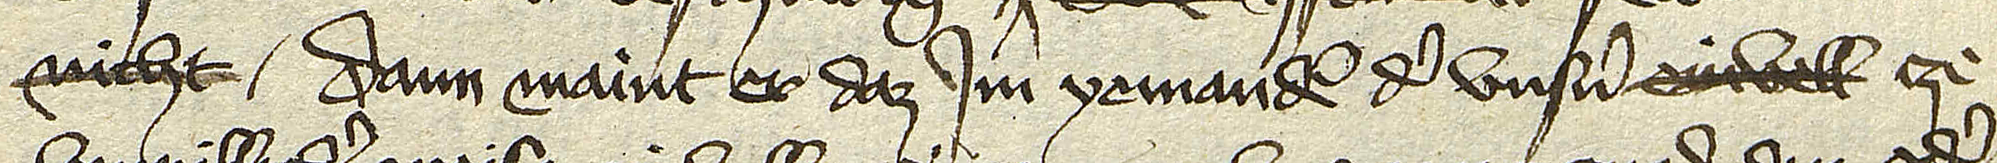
nicht / Dann maint er daʒ Im yemand* d* vnſn* einvell cʒe
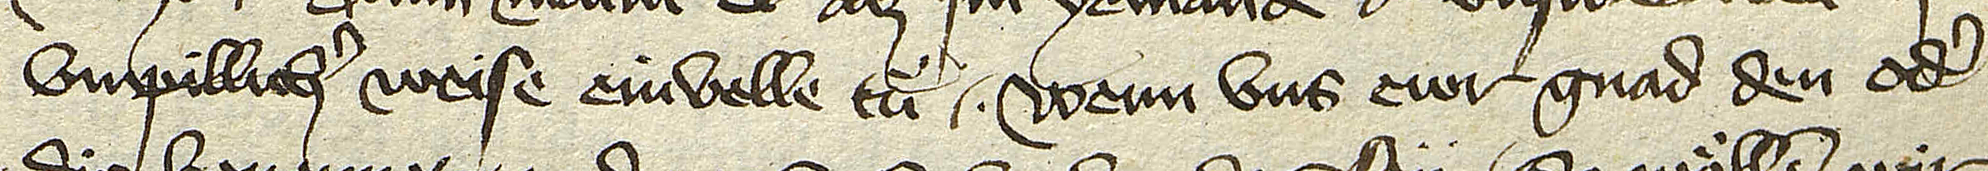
vmpillich* weiſe einvelle tü / . wenn vns ewr gnad den od*
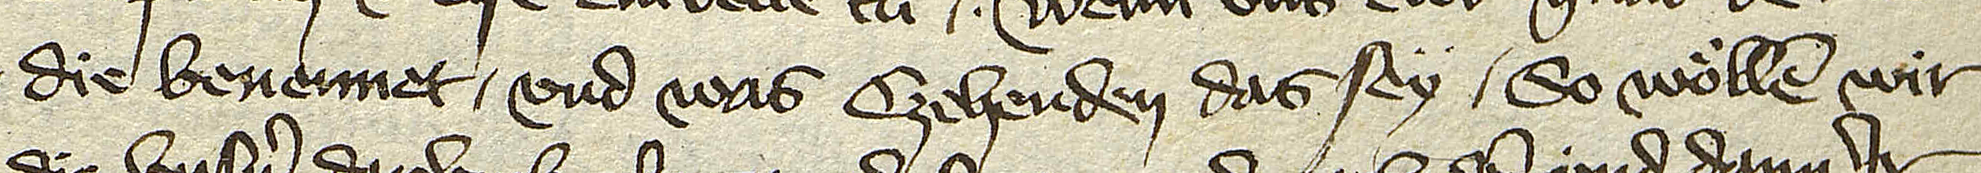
die benennet / vnd was Cʒehenden das ſey / So wölle* wir
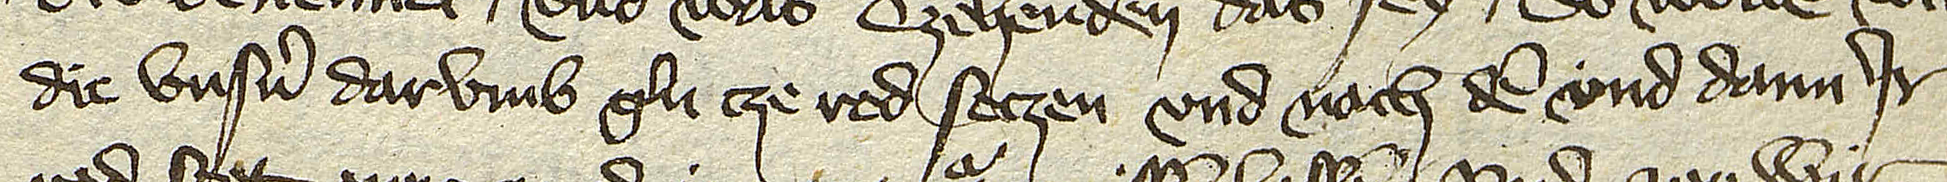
die vnſn* darvmb g*n cʒe red ſecʒen vnd nach d* vnd dann Ir
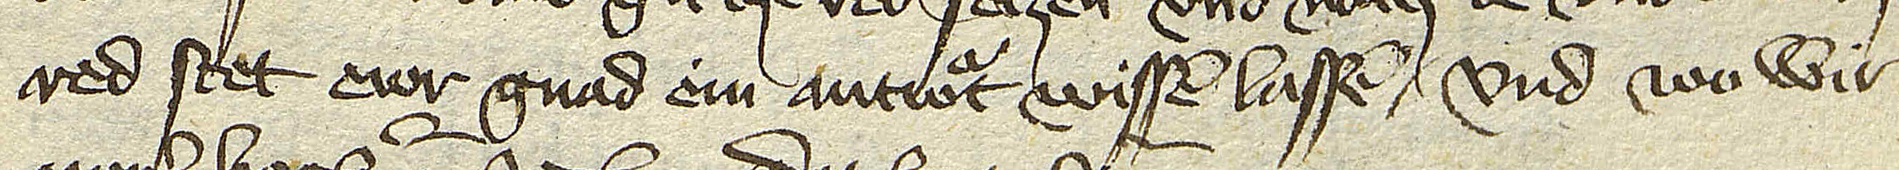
red ſtet ewr gnad ein antwt* wiſſe* laſſe* / vnd wo wir
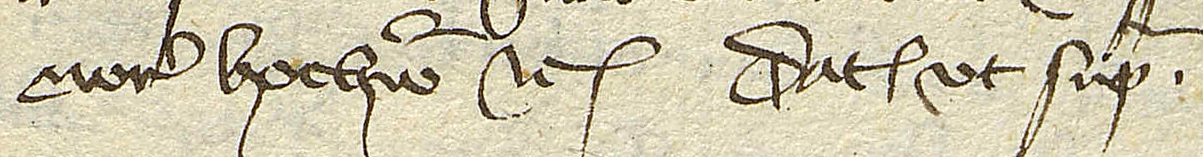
ewr* hochw* ec* Dat* vt ſup* .
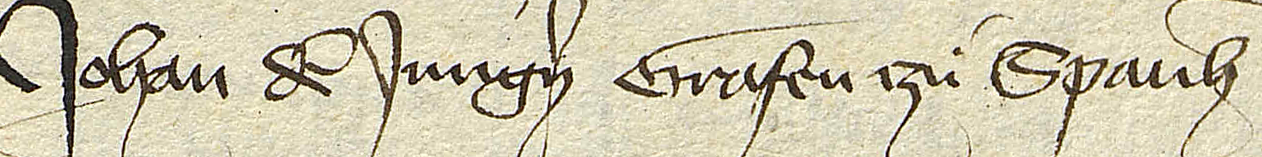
Iohan d* Iungn* Grafen cʒü Spanh*
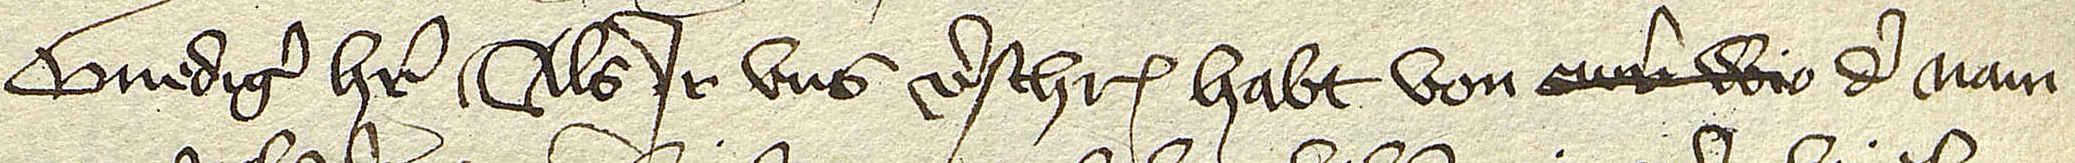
Gnedig* hr* / Als Ir vns v*ſchr* habt von ewr* Wi d* nam
